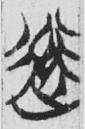○（率）
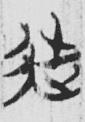徒
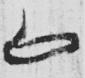㠯（以）
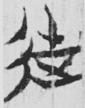徒
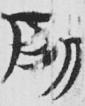所
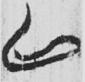㠯（以）
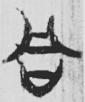同
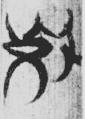死
